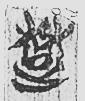楚
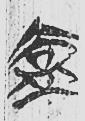盍
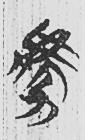{虎力}
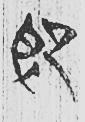即
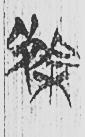殜
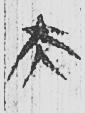夫
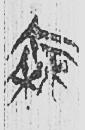秦
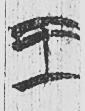王
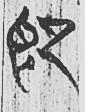即
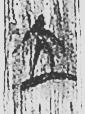立
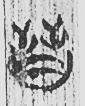晉
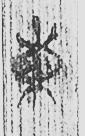柬
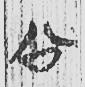公
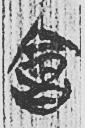會
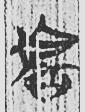者
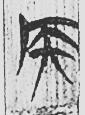侯
